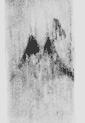八
